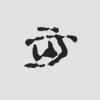可
